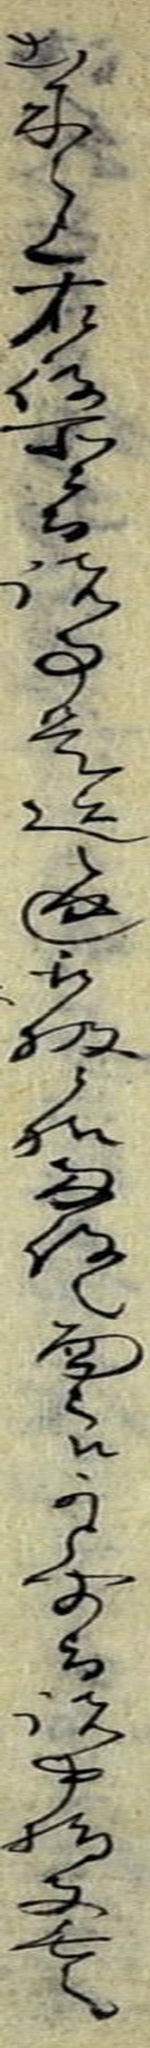出来候上右役所ニ而諸事是迄之通取扱候様両役之面々江可申聞旨諸事指支無之
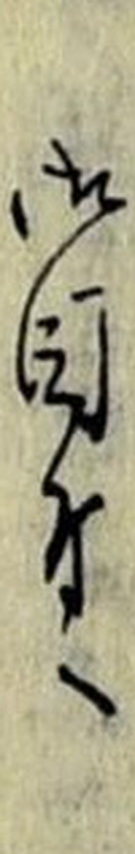御目付へ
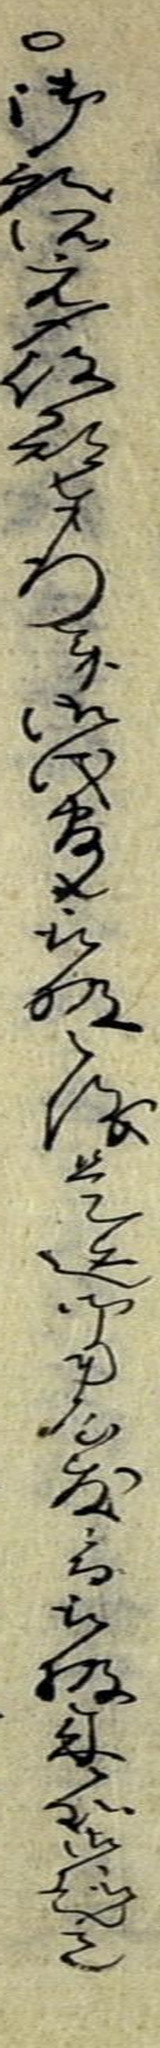〇御預所元〆役郡奉行并御代官共取扱之儀是迄御用屋敷ニ而取扱来候処御趣意
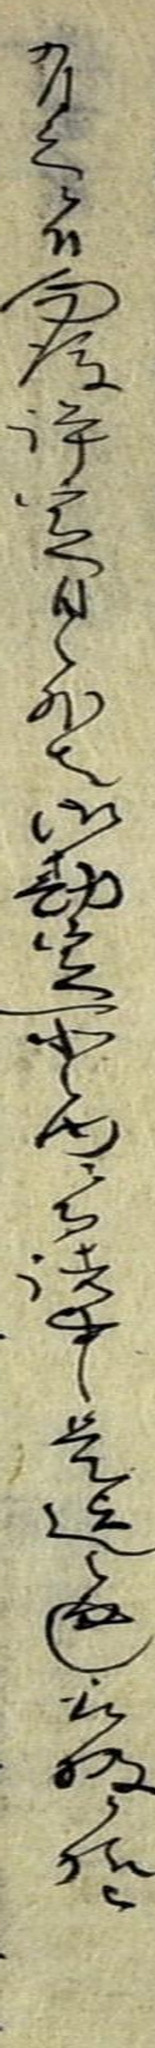有之ニ付向後評定日之外者御勘定所之内ニ而諸事是迄之通取扱候様被
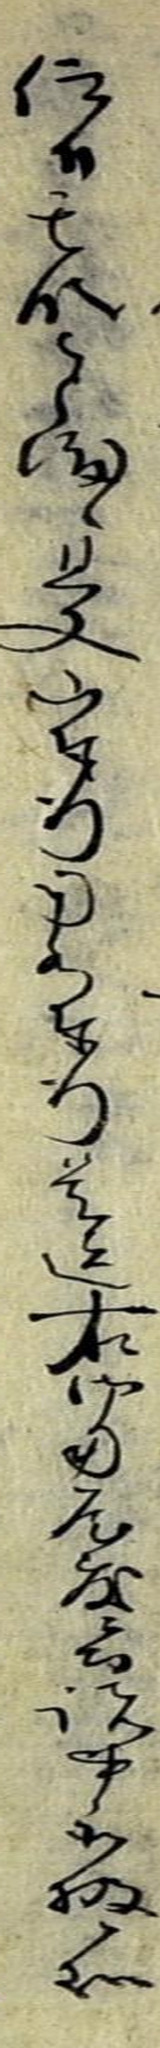仰付其段被申渡候且又山奉行用水奉行是迄右御用屋敷ニ而諸事取扱候処
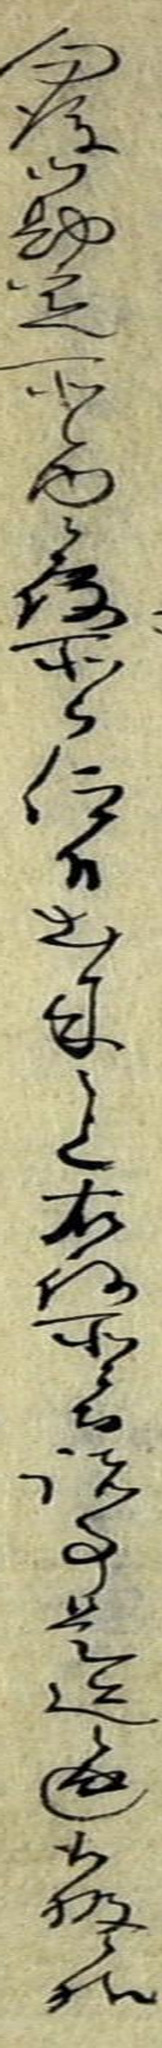向後御勘定所之内ニ役所被仰付出来候上右役所ニ而諸事是迄之通取扱候様
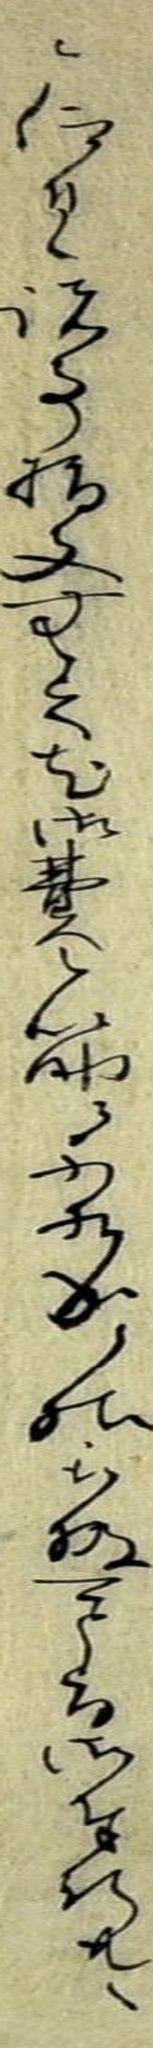被仰付候諸事指支無之尤御費之筋ニ不相成候様取扱可申旨御奉行共へ
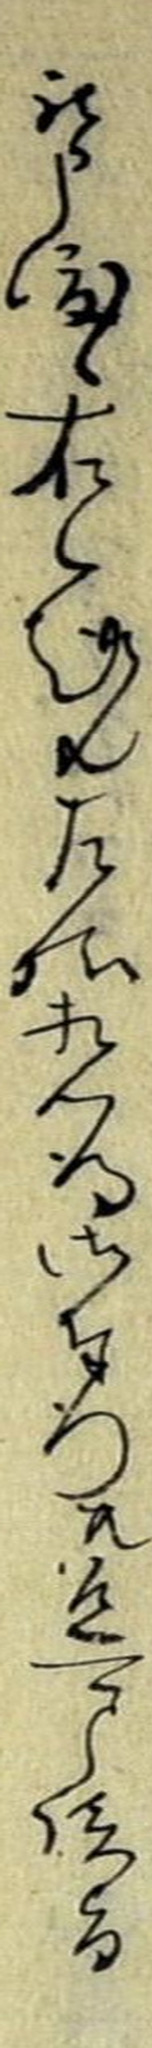被申渡候右之趣共左様相心得御奉行共宜可申談旨

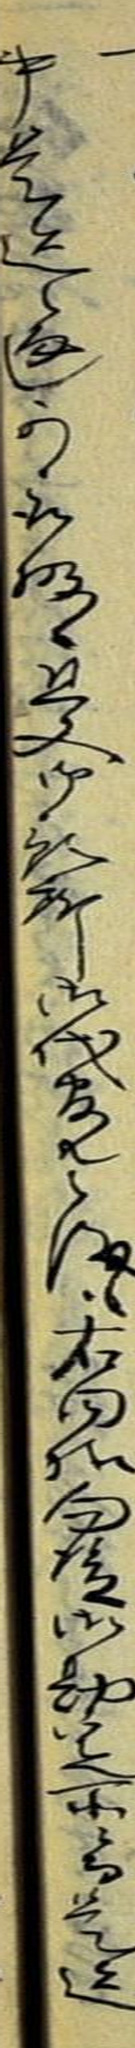事是迄之通可取扱候且又御預所御代官共之儀も右同様向後御勘定所ニ而是迄
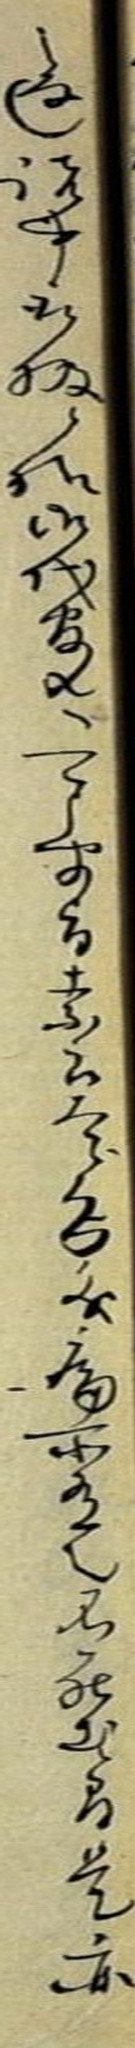之通諸事取扱候様御代官共へ可申聞旨奈良太郎右衛門義痛所有之不罷出候間是亦

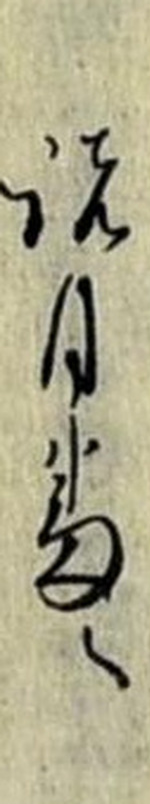諸月番へ
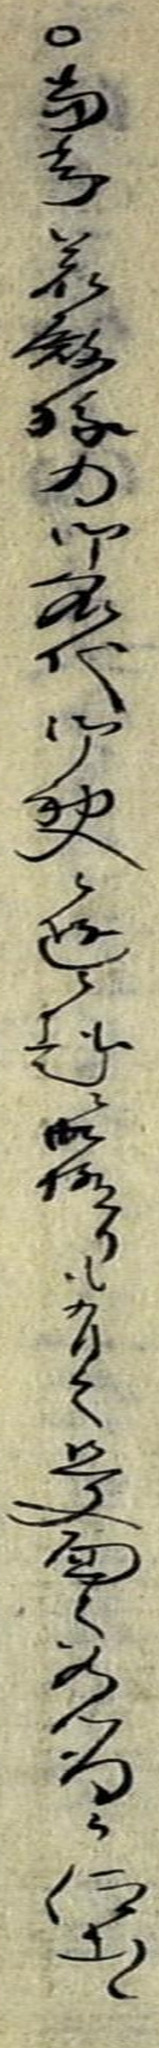〇当年若殿様為御名代御初入被遊候趣ニ御極りも有之且又面々為心得被仰出候
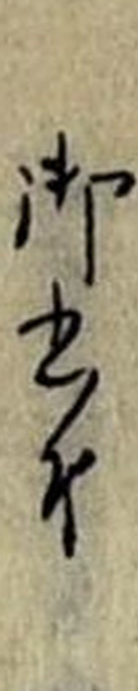御書付
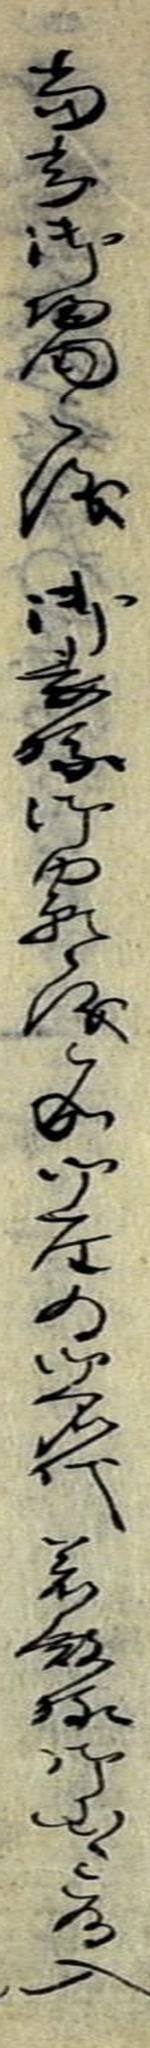当年御帰国之儀御表様御内願之儀被成御座為御名代若殿様御国へ被為入
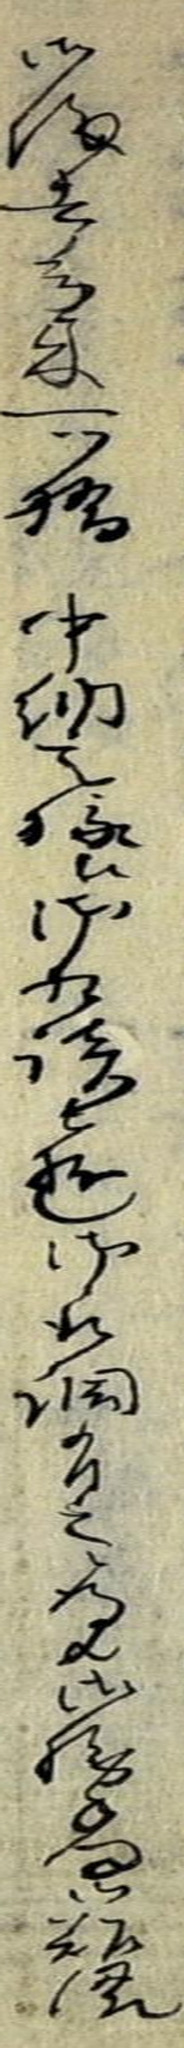御儀去年来一ツ橋中納言様江御相続被遊御取調有之候得共御勝手向御難渋
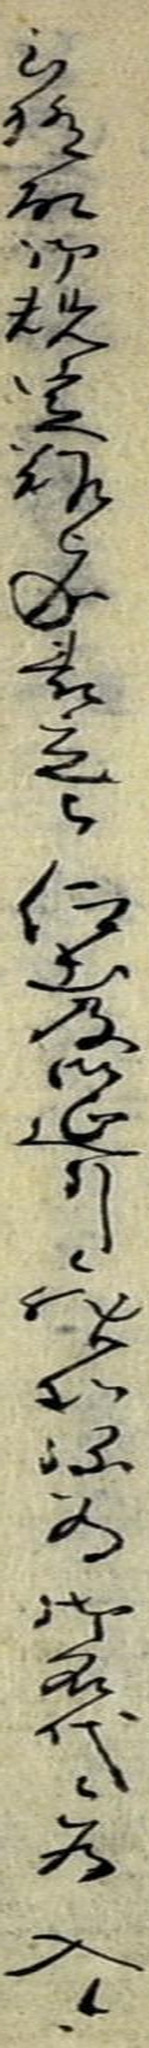至極候故御規定難被成表立被仰出及御延引候然ル処弥為御名代被為入候
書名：命令之部 三
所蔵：福井県文書館 Fukui Prefectural Archives
